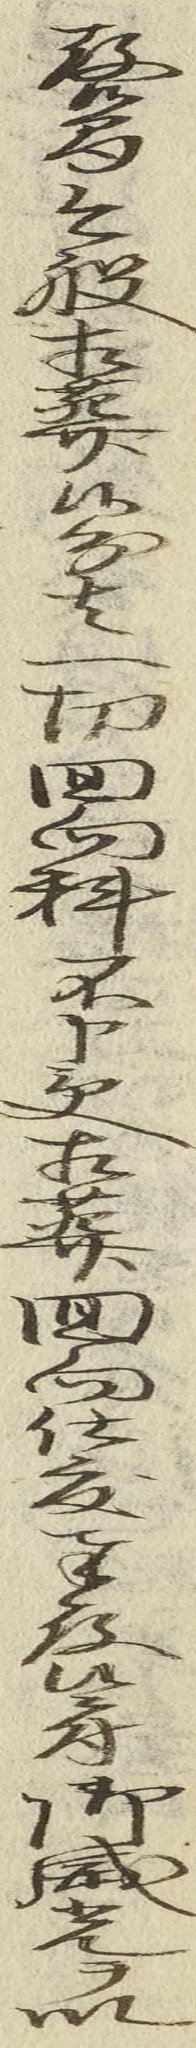存候間今般相葬候分者一切回向料不申受相葬回向仕度奉存候ニ付御威光ヲ以
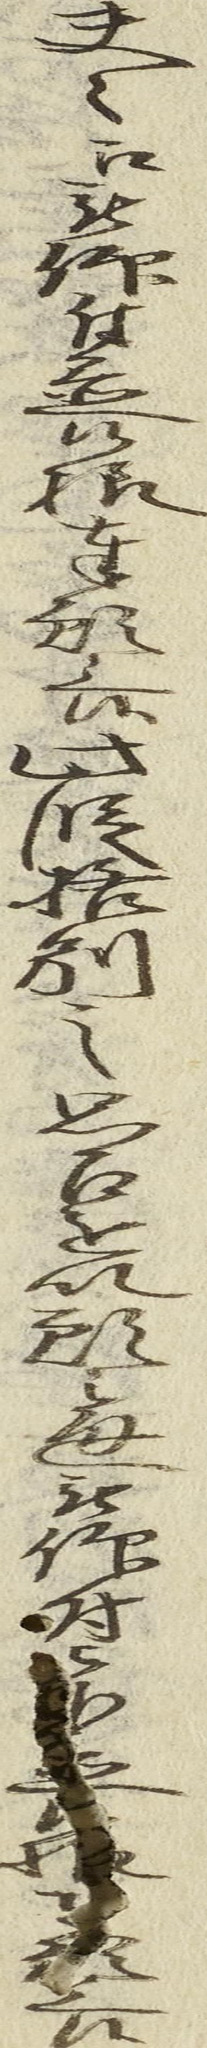夫々江被仰付置候様奉願上候此段格別之思召を以願之通被仰付被下置候様奉願上候
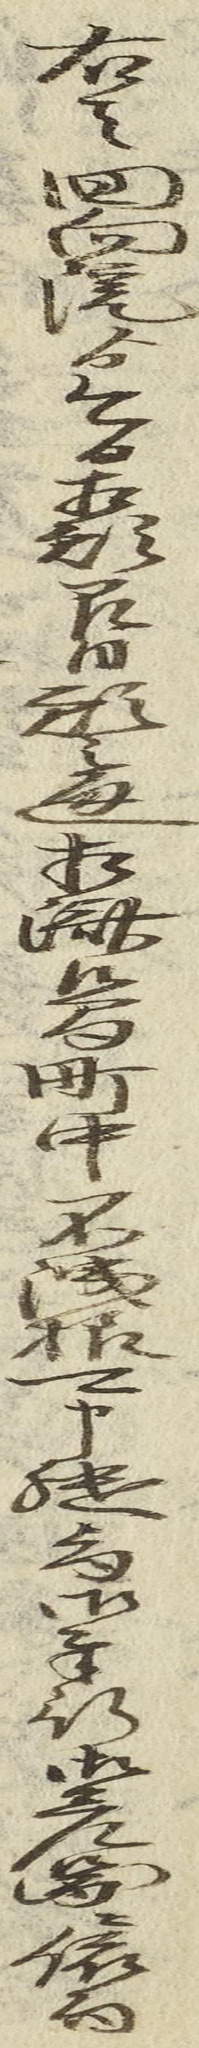右者回向院ゟ今日相願即日願之通相済候間町中不洩様可申継旨御奉行御差図ニ依而
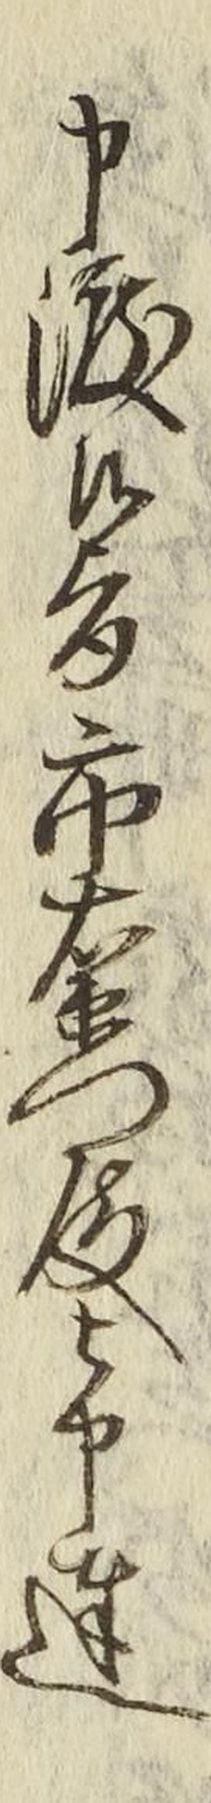申渡候旨市右衛門殿被申達
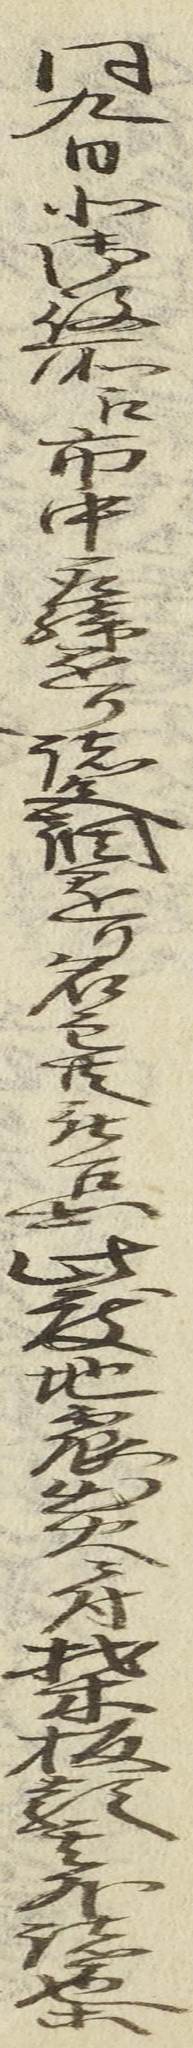一同九日北御役所江市中取締懸り諸色調懸り名主共被召出此度地震出火ニ付材木板類其外諸色等
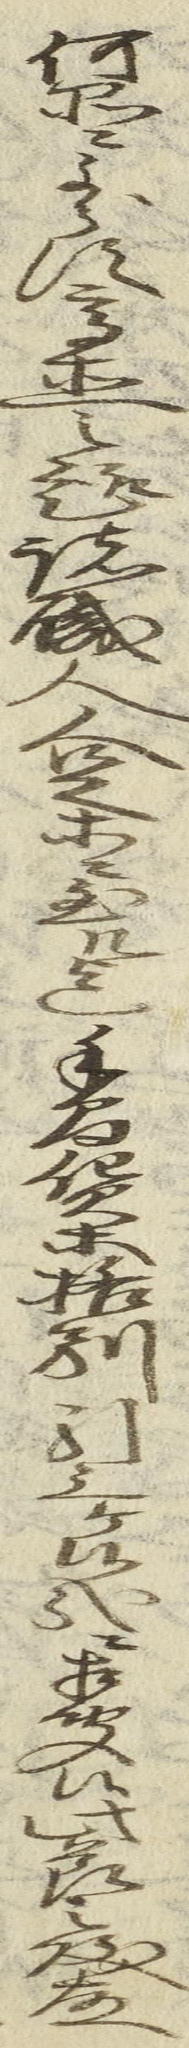何品ニよらす高直之趣諸職人人足等ニ至ル迄手間賃等格別引上ケ候哉ニ相聞候此節之儀故
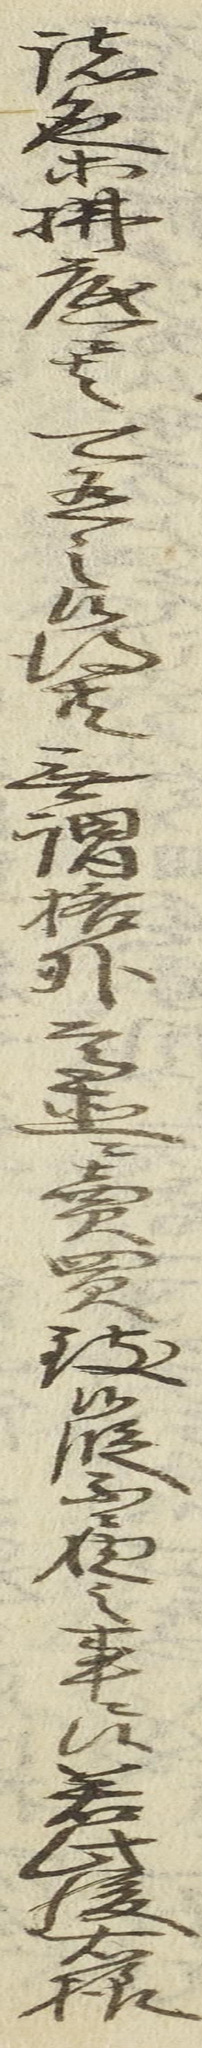諸色等払底ニ者可有之候得共無謂格外高直ニ売買致候段不届之事ニ候若此後右様
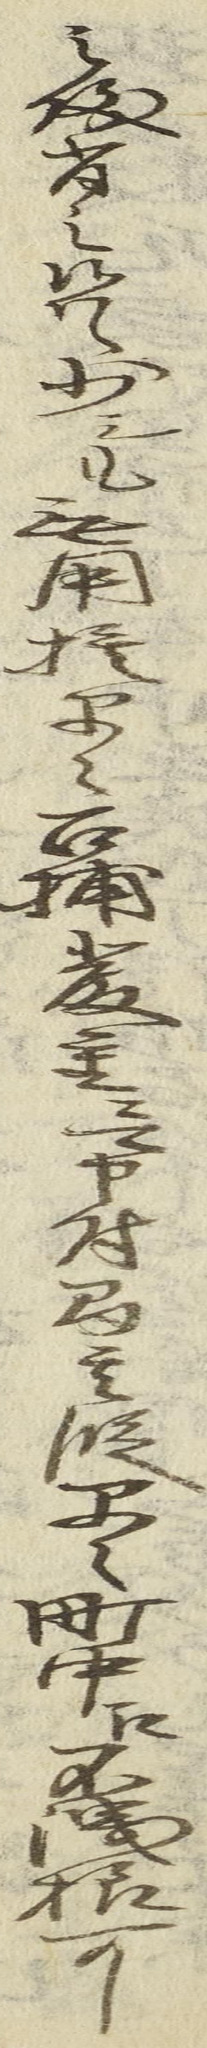之儀有之候はゝ少シも無用猶早々召捕厳重ニ可申付間其段早々町中江不洩様可
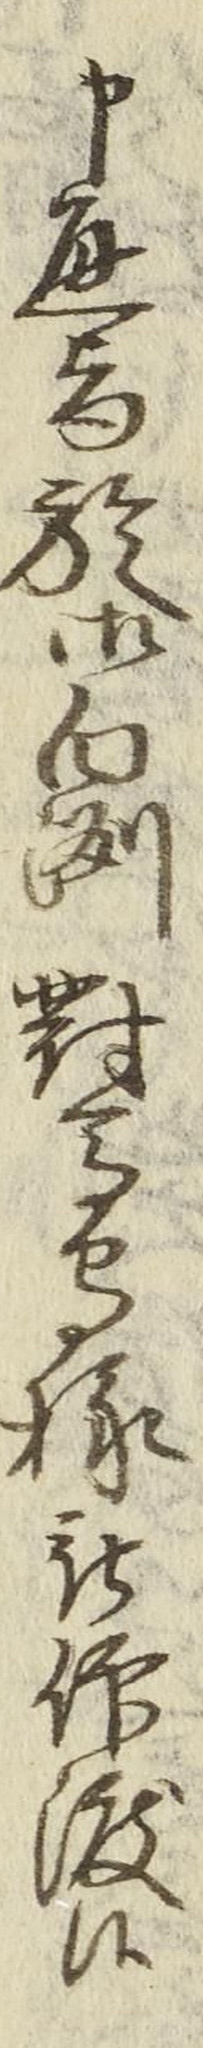申通旨於御白洲対馬守様被仰渡候
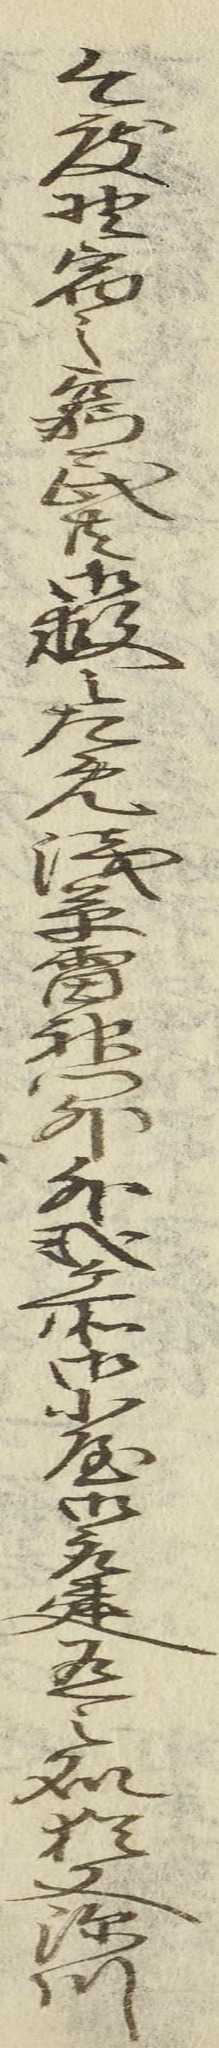一今度野宿之窮民共御救之ため浅草雷神門外外弐ケ所御小屋御取建有之処猶又深川
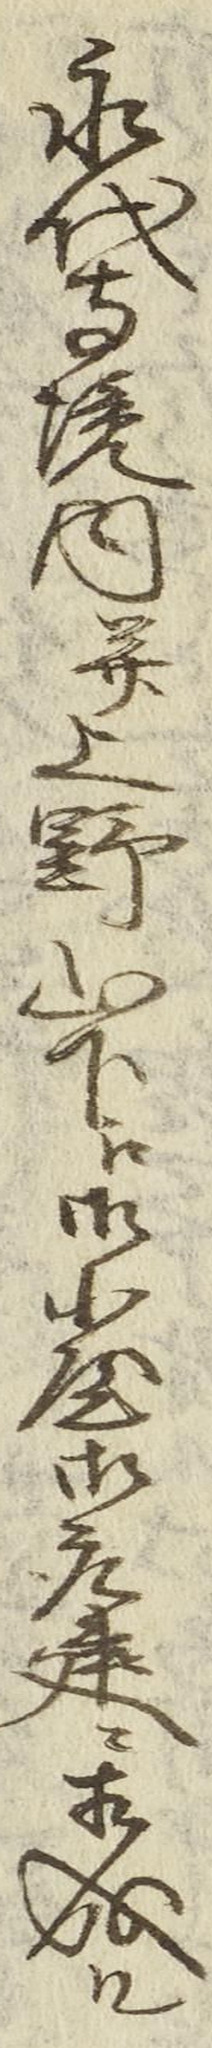永代寺境内幷上野山下江御小屋御取建ニ相成ル
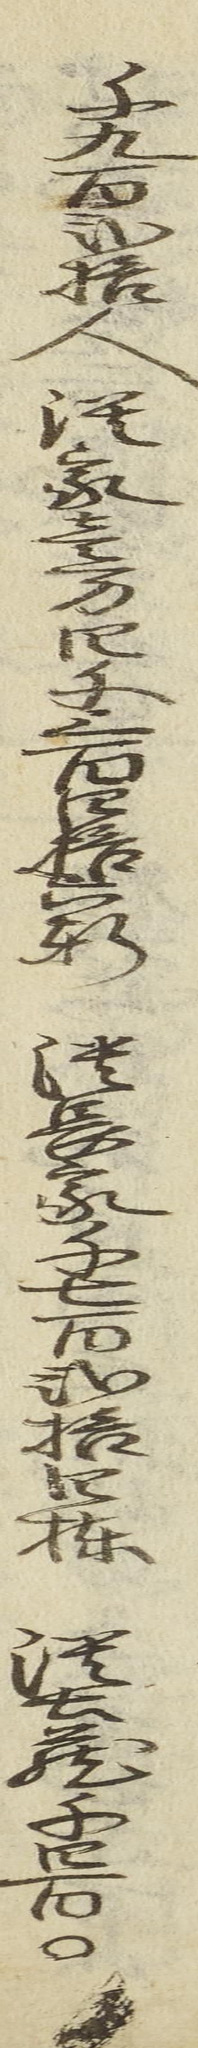千九百弐拾人潰家壱万四千三百四拾六軒潰長屋千七百弐拾四棟潰土蔵千四百○
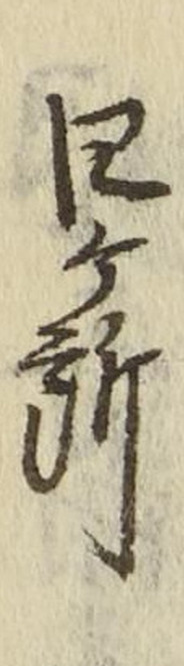四ケ所

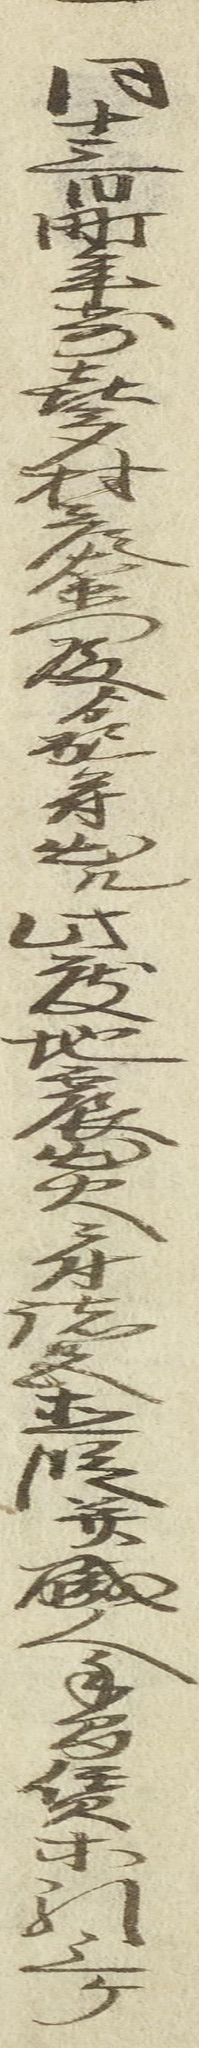一同十三日年寄喜多村彦右衛門殿ゟ配符出ル此度地震出火ニ付諸色直段幷職人手間賃等引上ケ
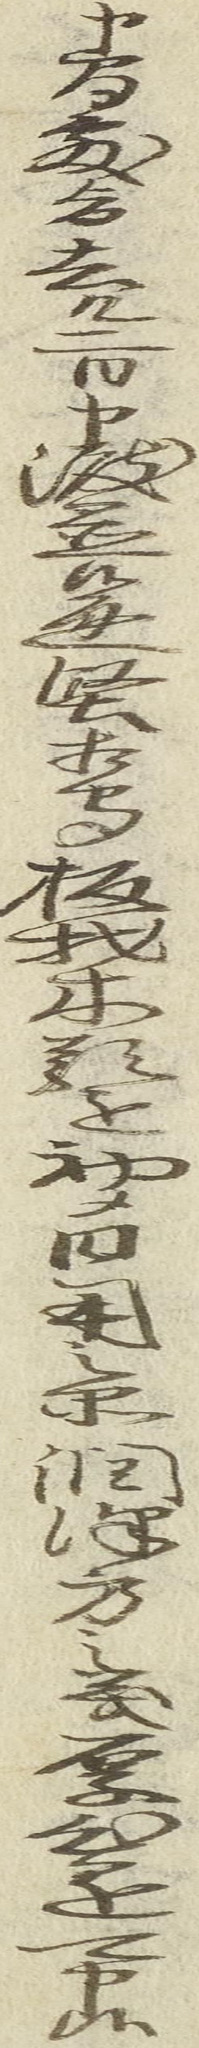申間敷旨去ル二日申渡置候通堅相守板材木類を初メ日用之品潤沢方之義厚心懸可申候
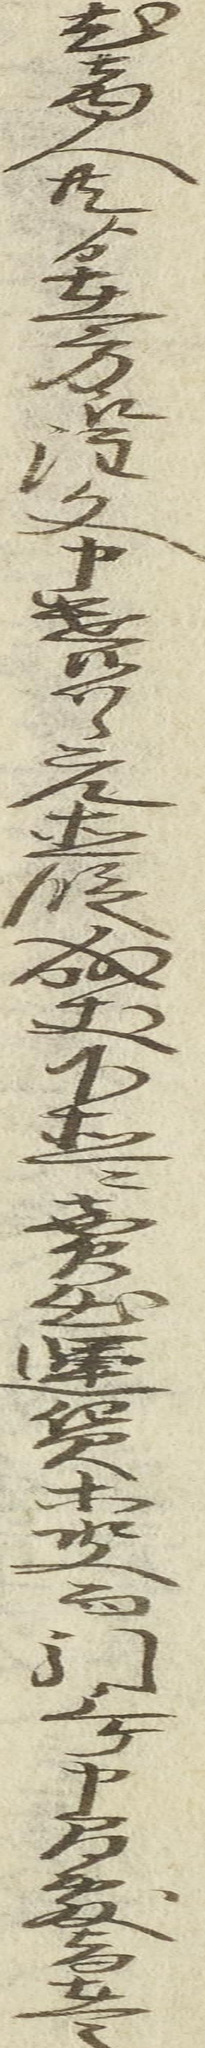尤商人共ゟ在方江注文申遣候はゝ元直段成丈下直ニ売出運賃等決而引上ケ申間敷旨在々
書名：安政二年震災記事　完
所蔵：東京大学地震研究所図書室 Earthquake Research Institute Library, The University of Tokyo, JAPAN
